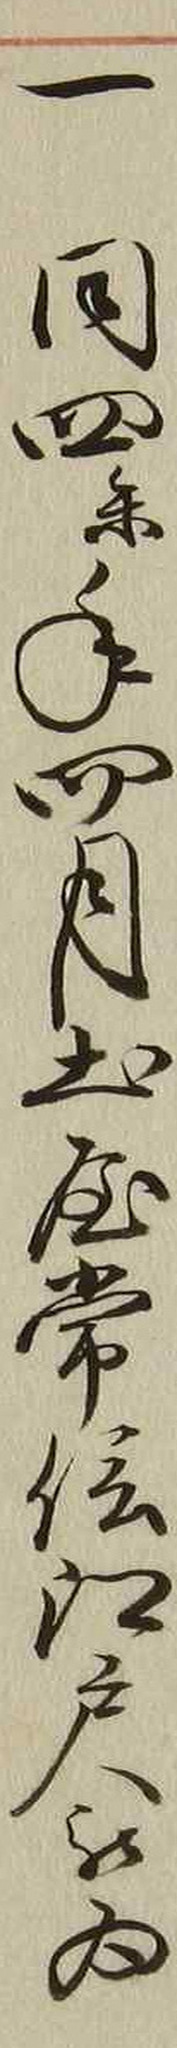一同四未年四月土屋常信江戸へ被為
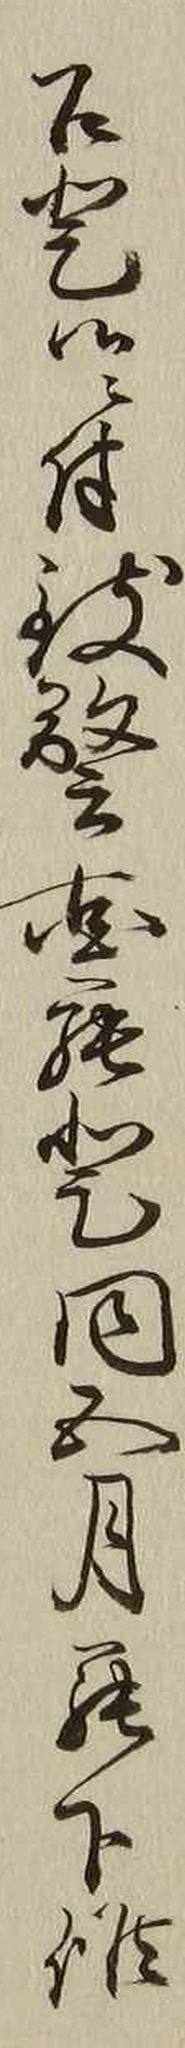召登候ニ付致警固罷登同五月罷下候
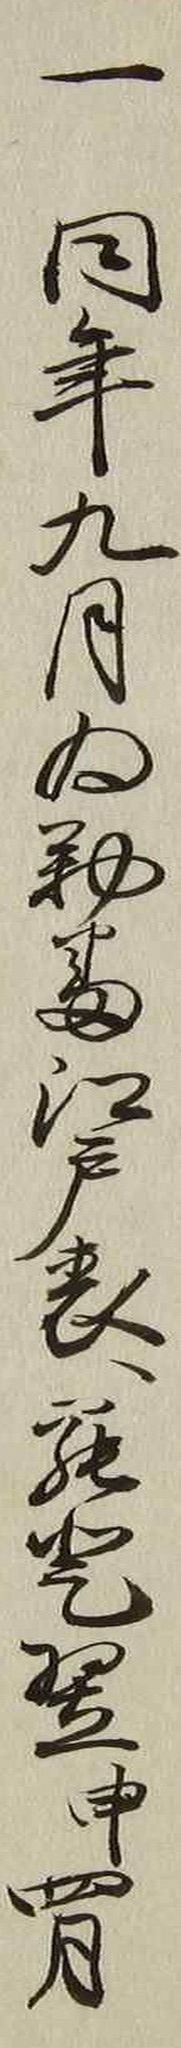一同年九月為勤番江戸表へ罷登翌申四月
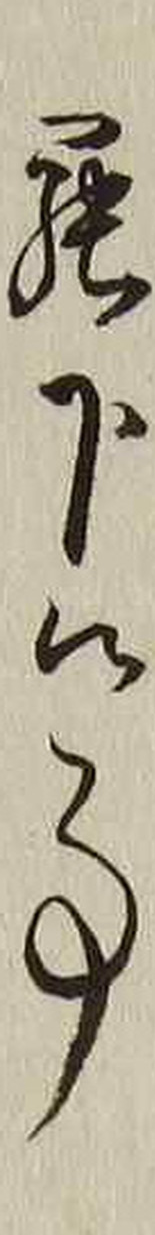罷下候事
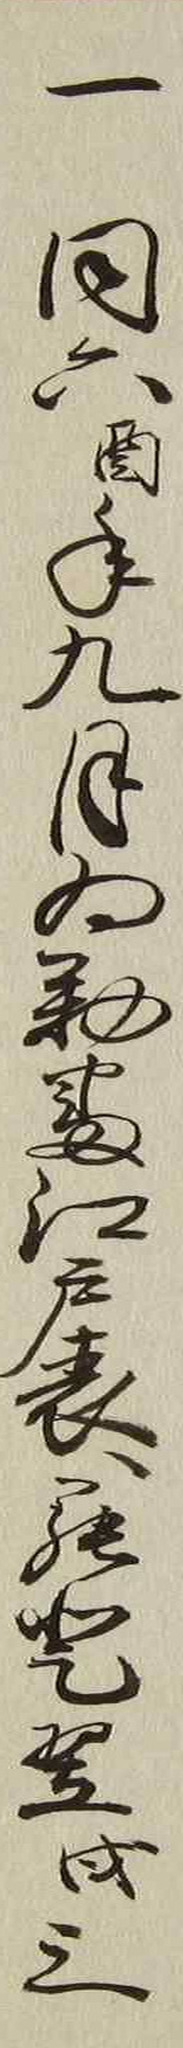一同六酉年九月為勤番江戸表へ罷登翌戌三
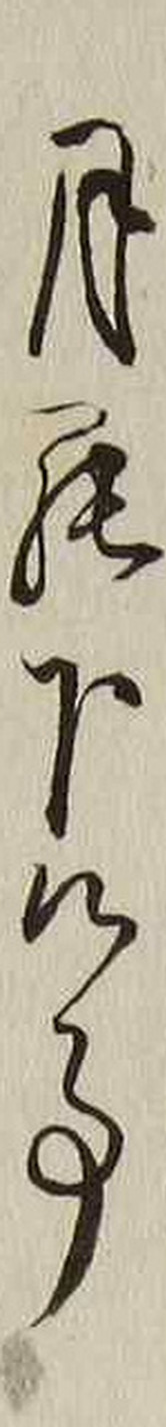月罷下候事
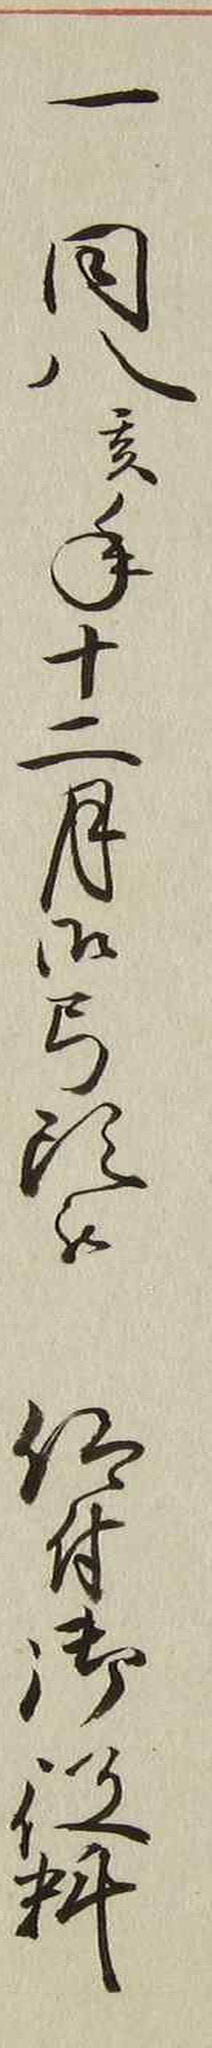一同八亥年十二月御弓頭被仰付御役料
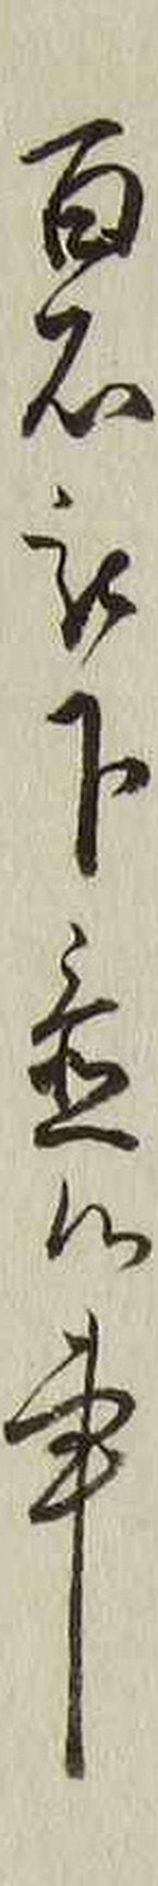百石被下置候事
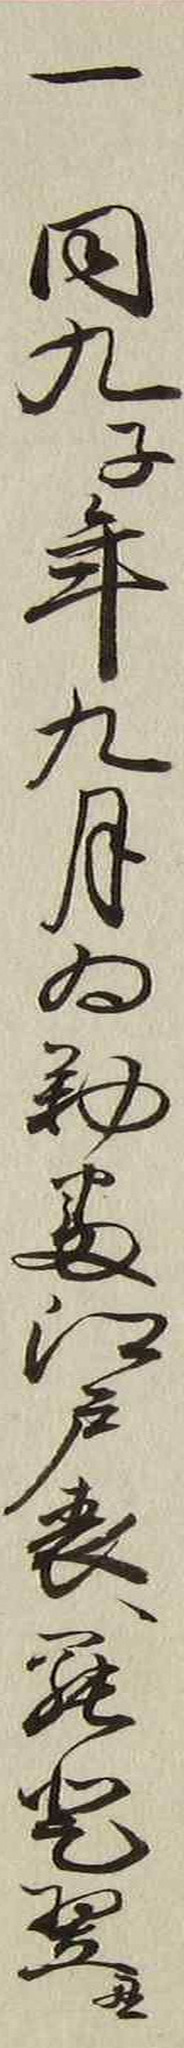一同九子年九月為勤番江戸表へ罷登翌丑
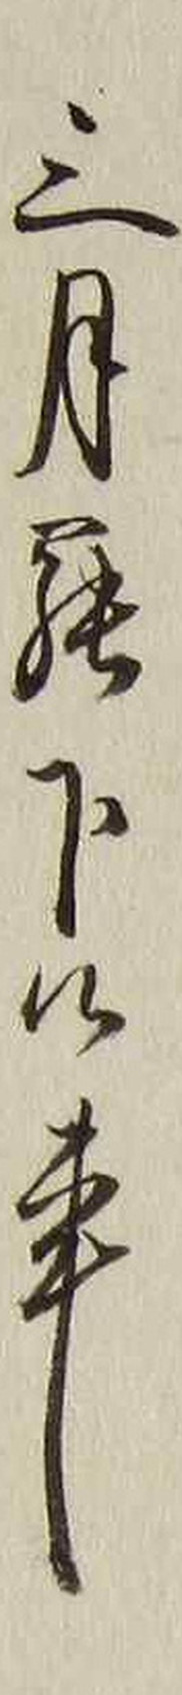三月罷下候事
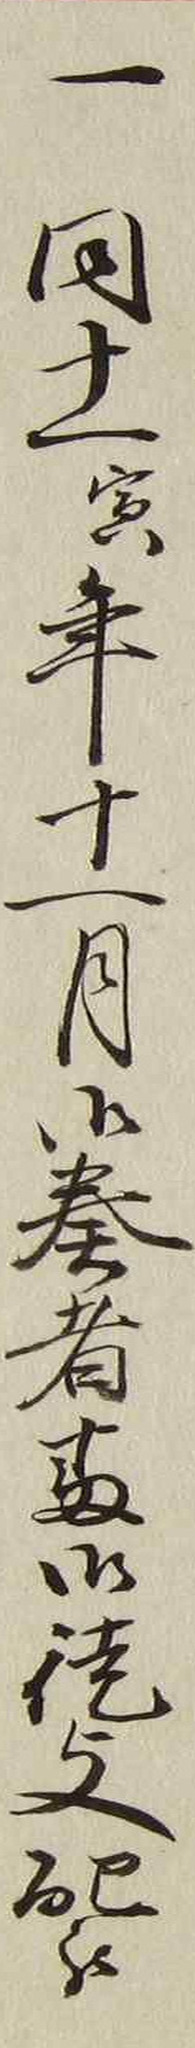一同十一寅年十一月御奏者番御徒支配被
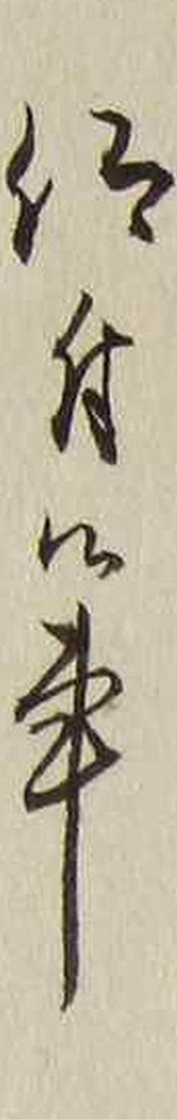仰付候事

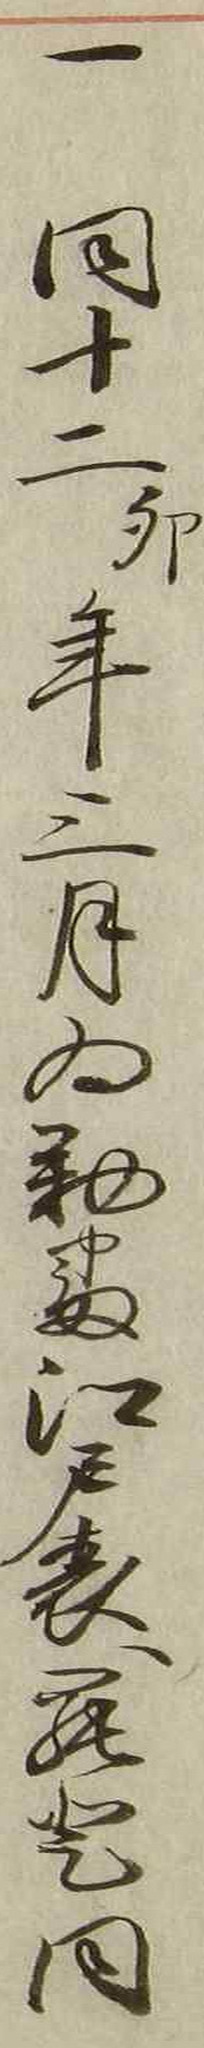一同十二卯年三月為勤番江戸表へ罷登同
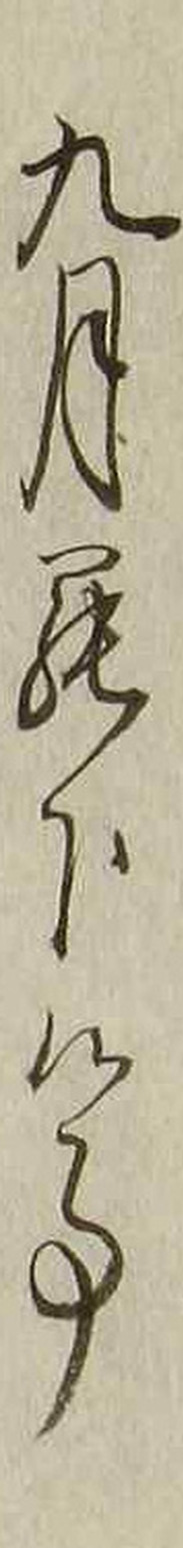九月罷下候事
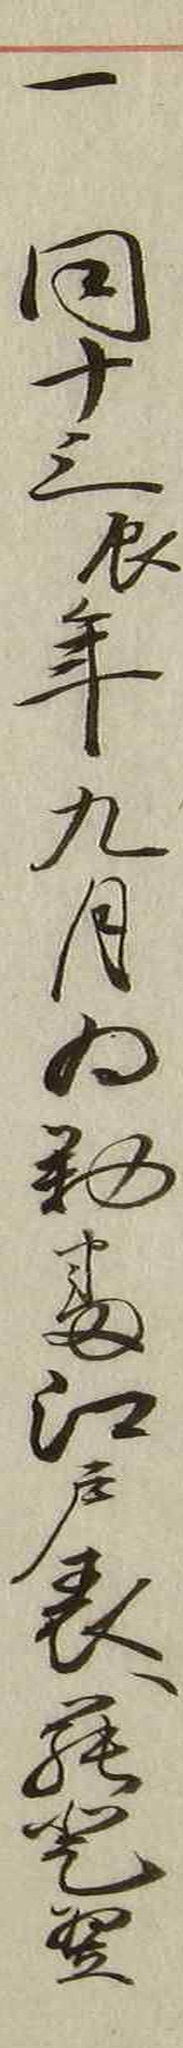一同十三辰年九月為勤番江戸表へ罷登翌
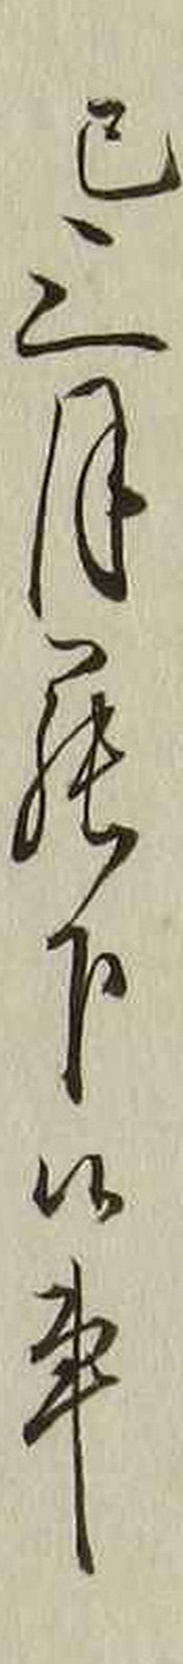巳三月罷下候事
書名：諸士系譜　巻之21　い之部21
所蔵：会津若松市立会津図書館
